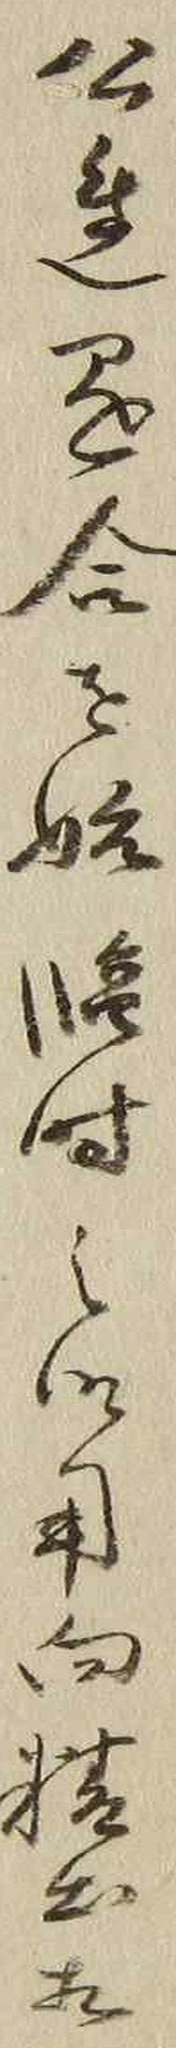公辺懸合を始臨時之御用向精出相
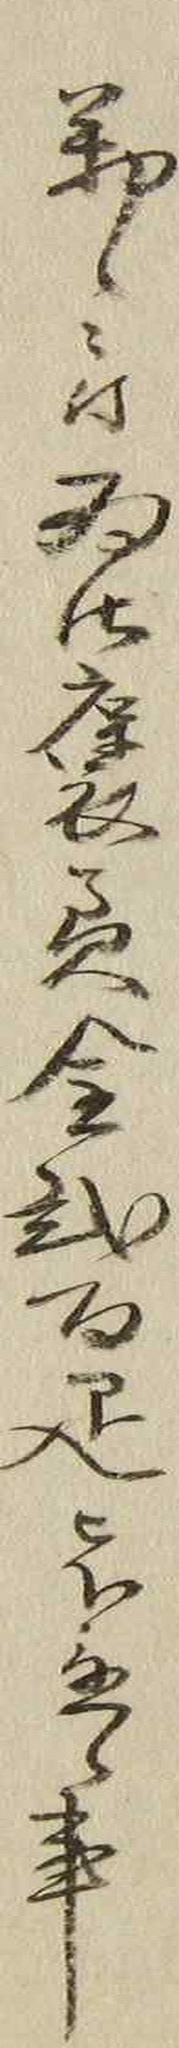勤候ニ付為御褒美金弐百疋被下置候事
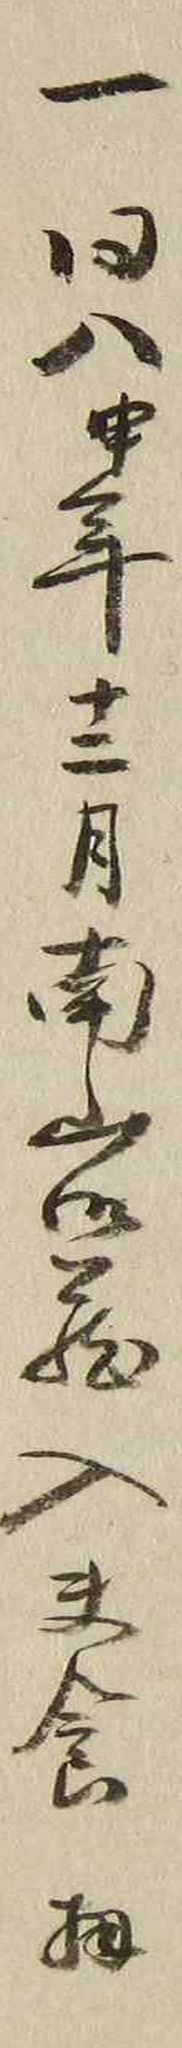一同八申年十二月南山御蔵入夫食拝
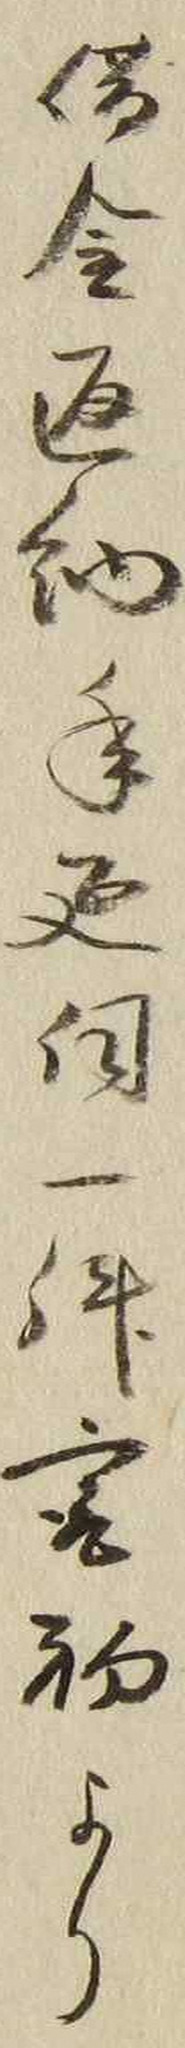借金返納年延伺一件最初より
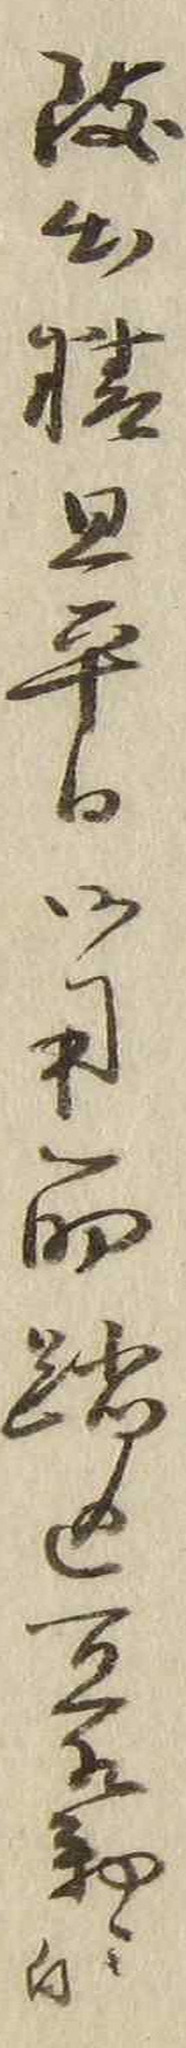致出精且平日御用筋踏込宜相勤候ニ付

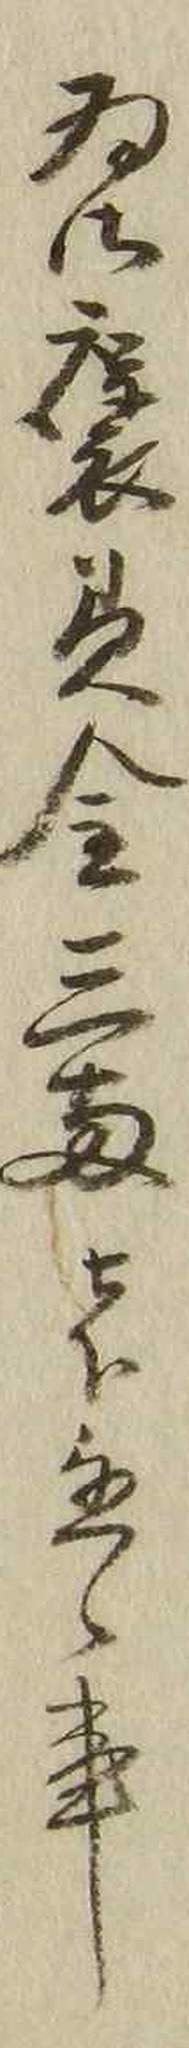為御褒美金三両被下置候事
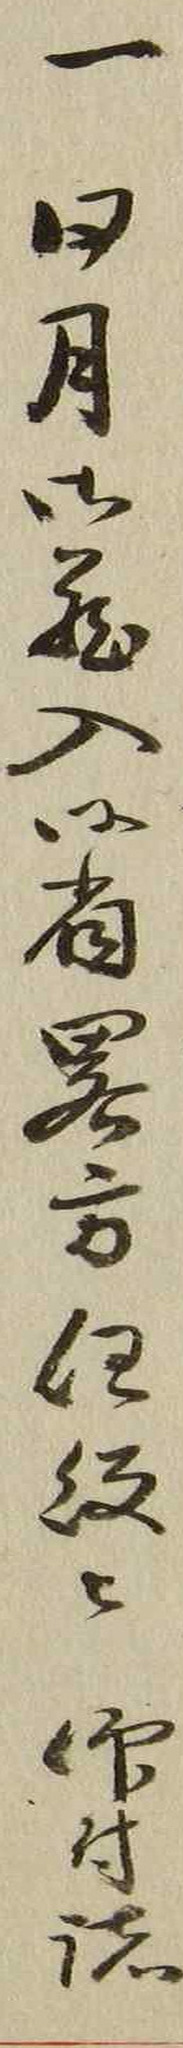一同月御蔵入御省略方任役被仰付諸
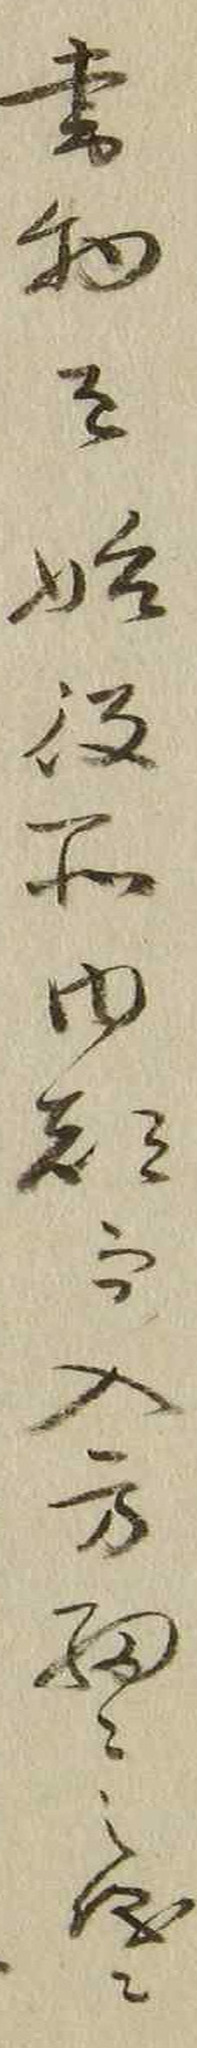書物を始役所内都而入方細々之儀ニ
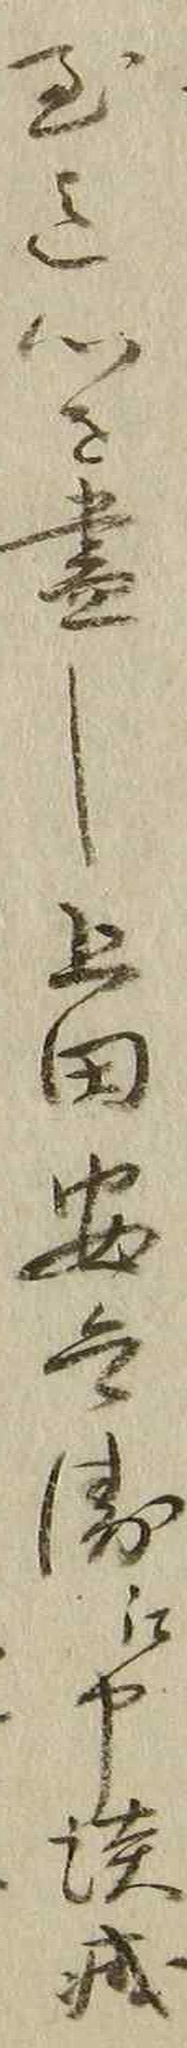至迄心を尽し上田安兵衛江申談減
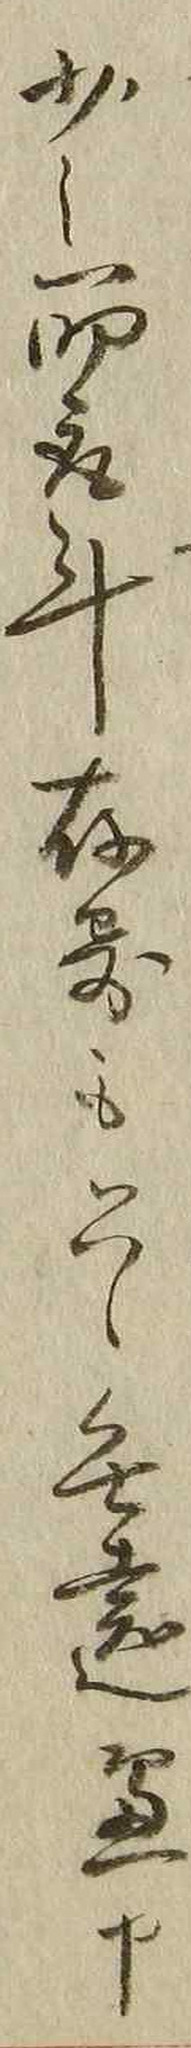少之筋取計存寄も候ハヽ無遠慮申
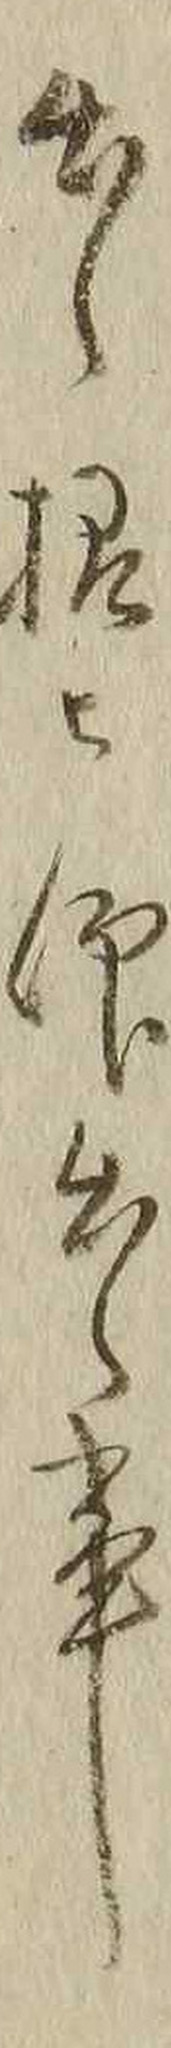出候様被仰出候事
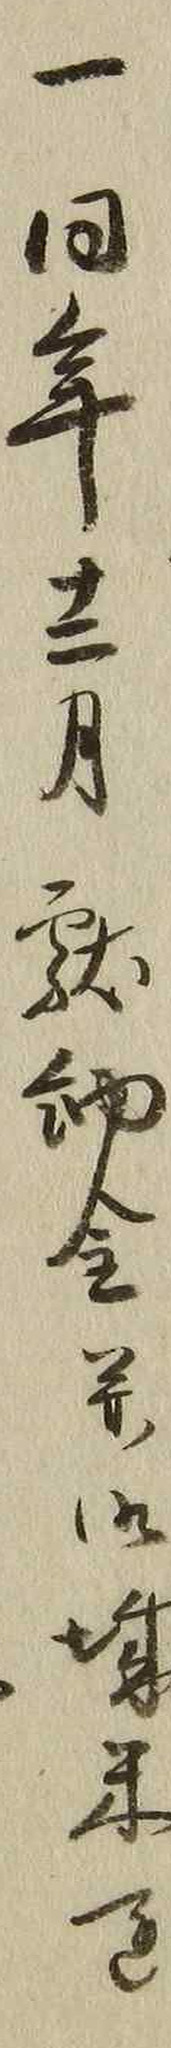一同年十二月献納金并御城米過
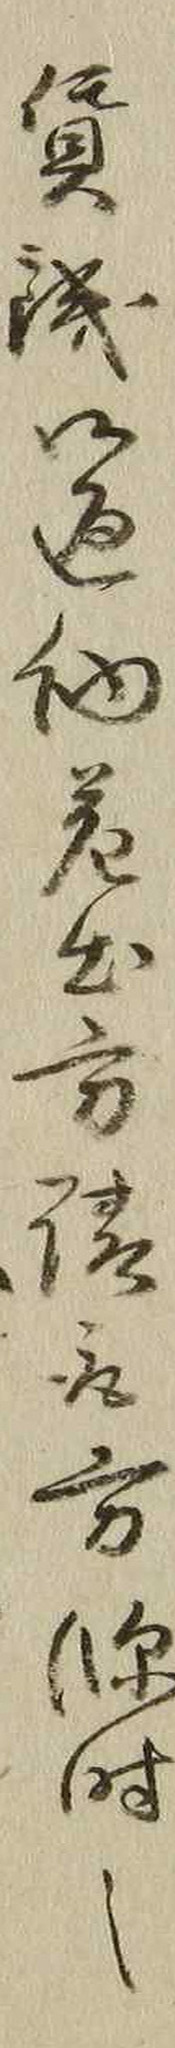賃銭御返納差出方請取方臨時之
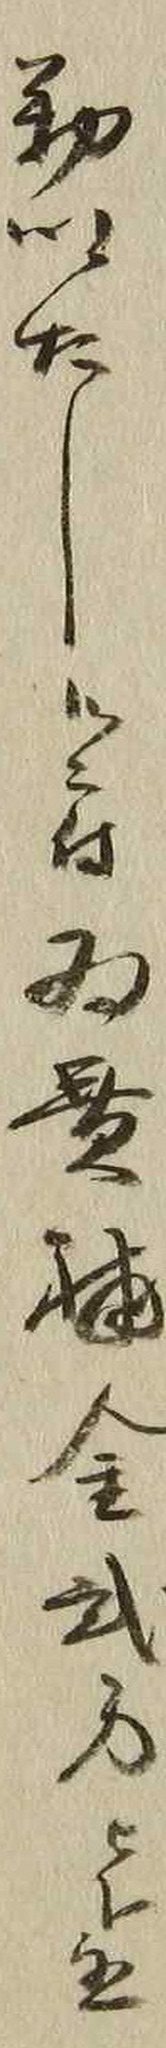勤いたし候ニ付為費補金弐分被下置
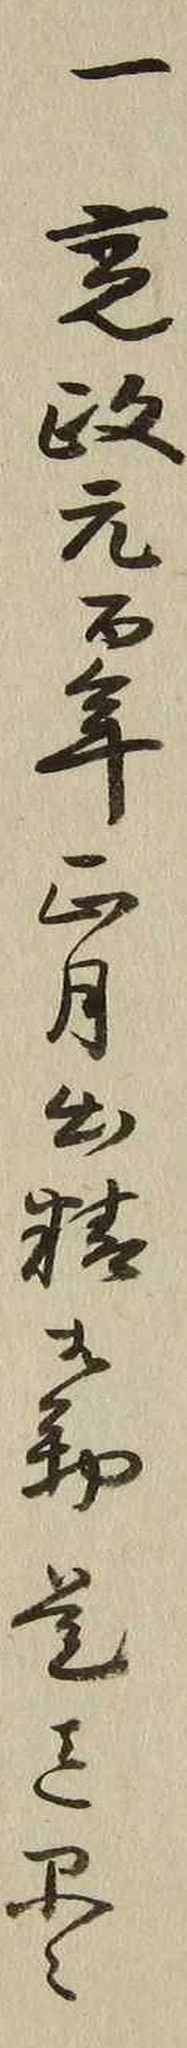一寛政元酉年正月出精相勤是迄品々
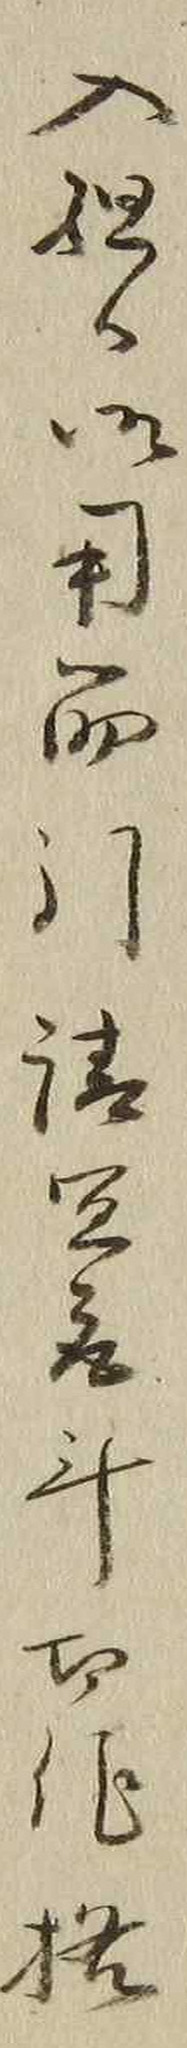入組候御用筋引請宜取計切作格
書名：諸士系譜　巻之236　ふ之部4
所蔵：会津若松市立会津図書館
